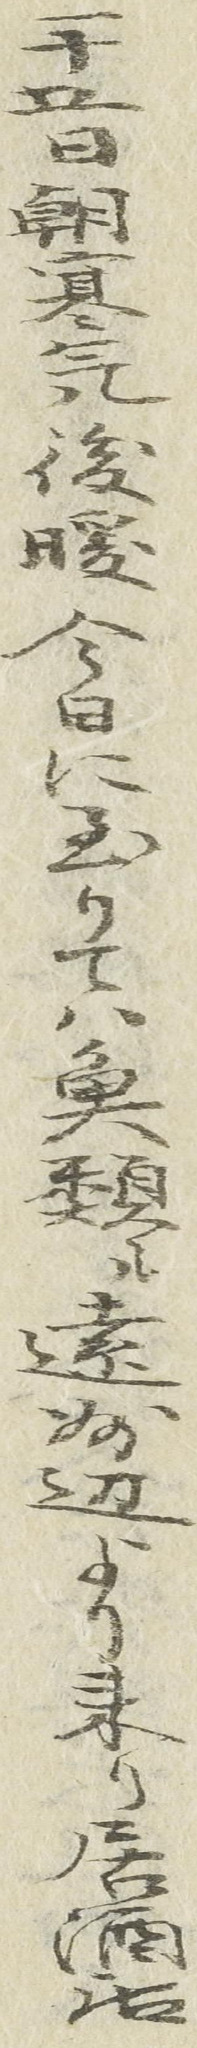一十五日朝寒気後暖今日に至りては魚類も遠州辺より来り居酒店
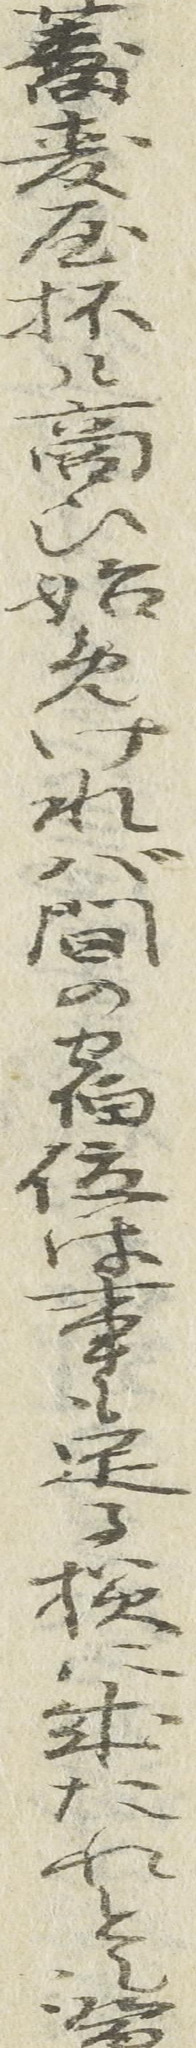蕎麦屋抔も商ひ始めければ間の宿位は事も足る様に成たれとも醤
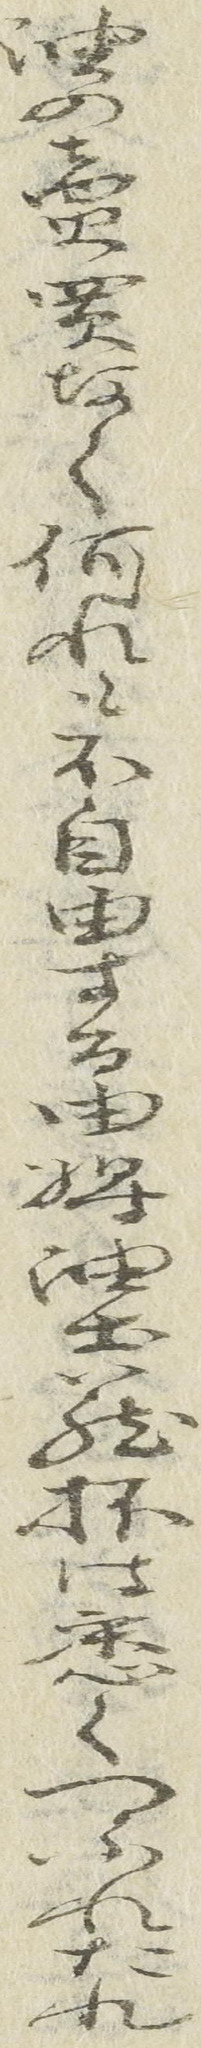油の売買なく何れも不自由する由将油土蔵抔は悉くつふれたれ
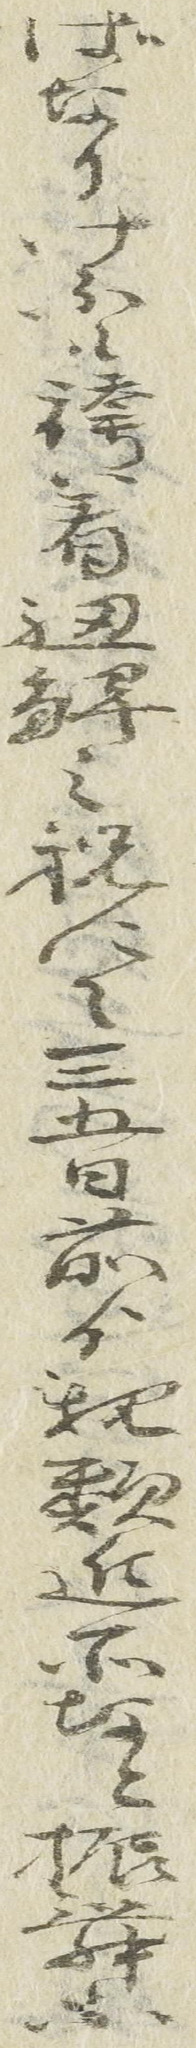ばなりけふも袴着紐解之祝にて三五日前ゟ親類近所なと振舞ふ
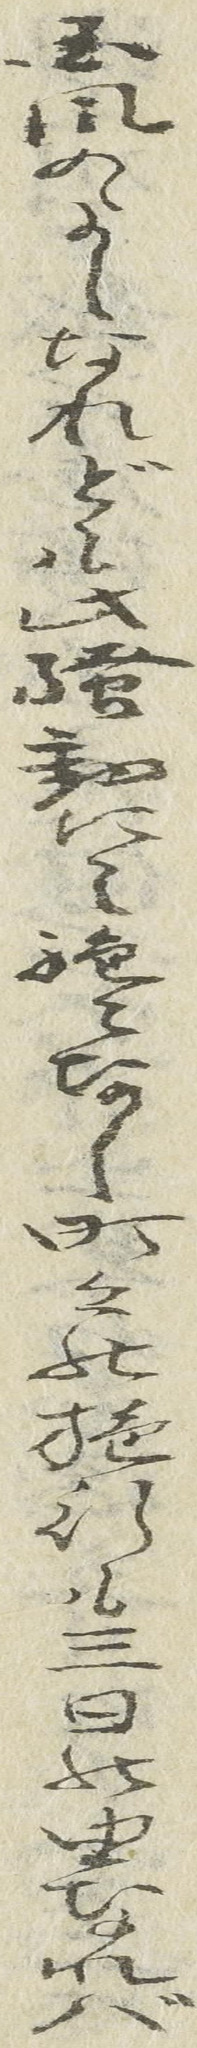国風のよしなれども此騒動にて弛々なし町々の施行も三日の由なれば
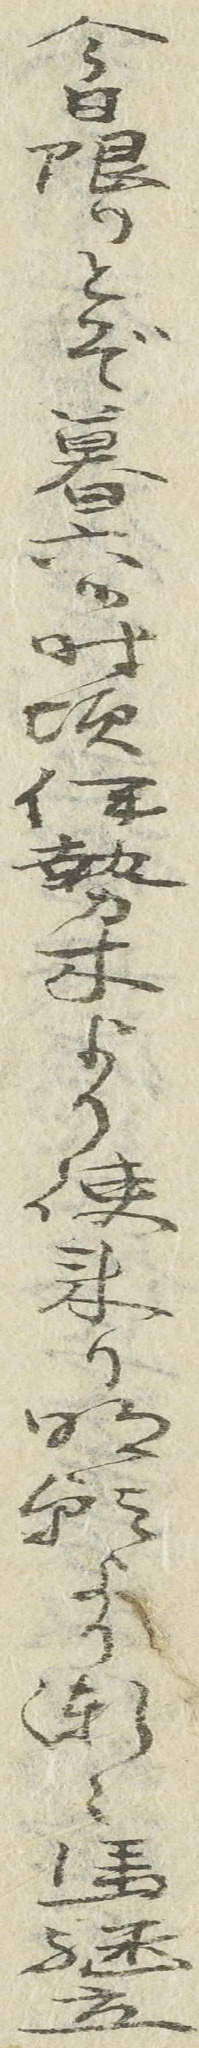今日限りとぞ暮六ツ時頃伊勢木より使来り明朝より漸々馬継立
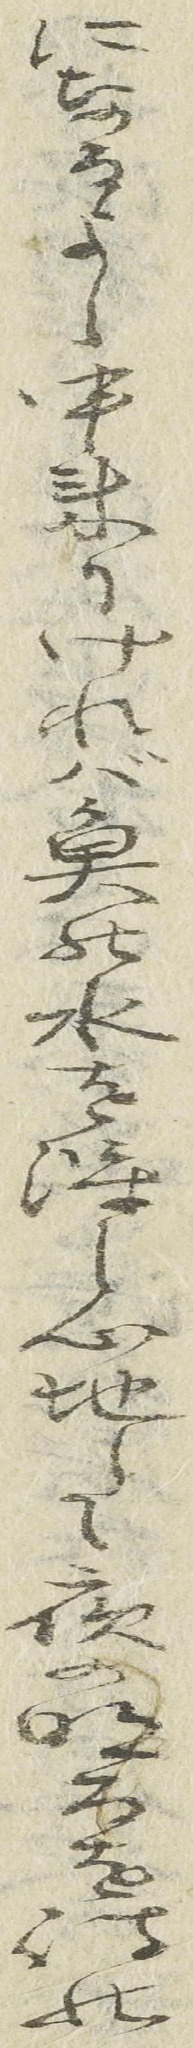になるよし申来りければ魚の水を得し心地して夜の明るを待の
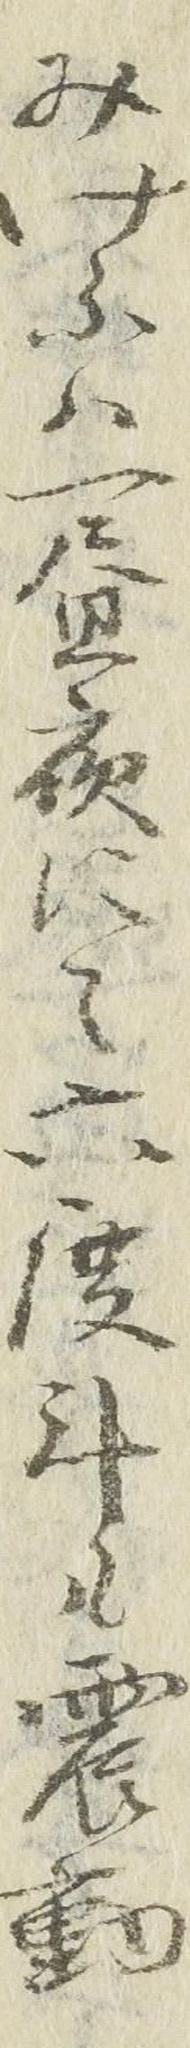みけふは一昼夜にて六度斗も震動
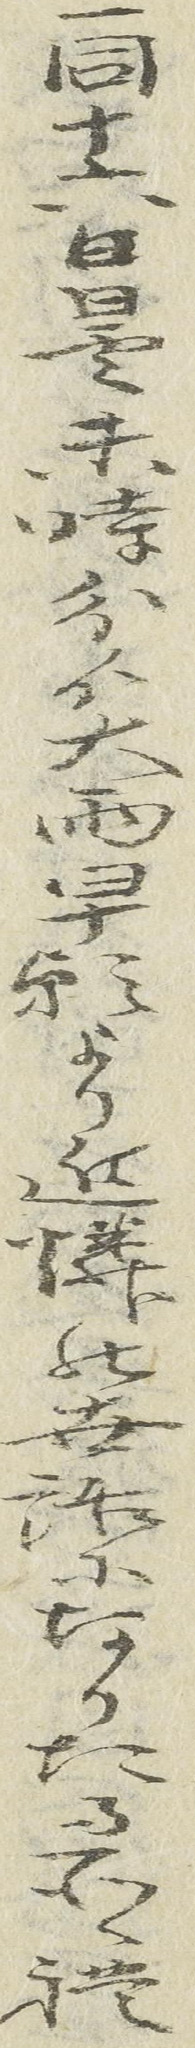一同十六日曇未時分ゟ大雨早朝より近隣の世話になりたる所へ禮

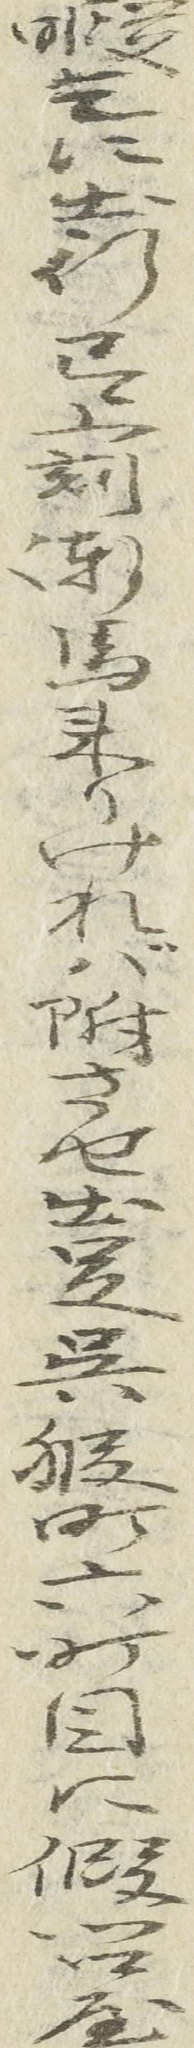暇乞に出行巳上刻漸馬来りければ附させ出足呉服町六丁目に假問屋
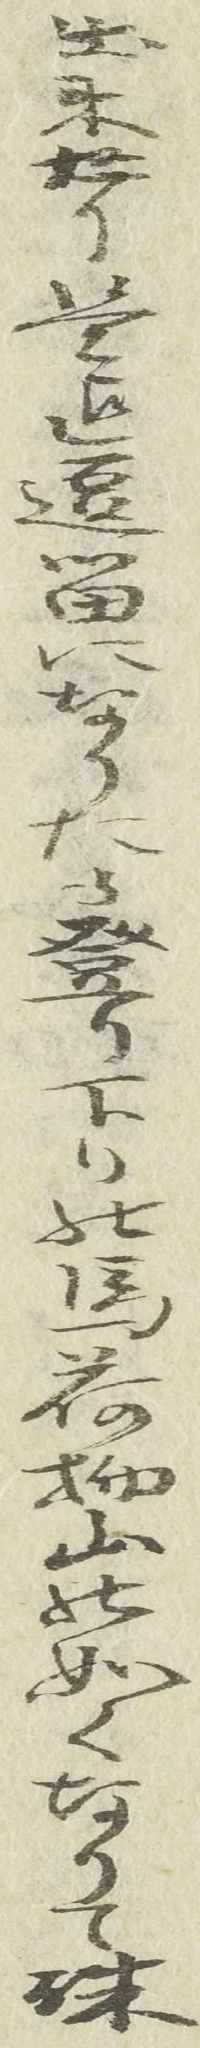出来たり是迄逗留になりたる登り下りの馬荷物山の如くなりて殊
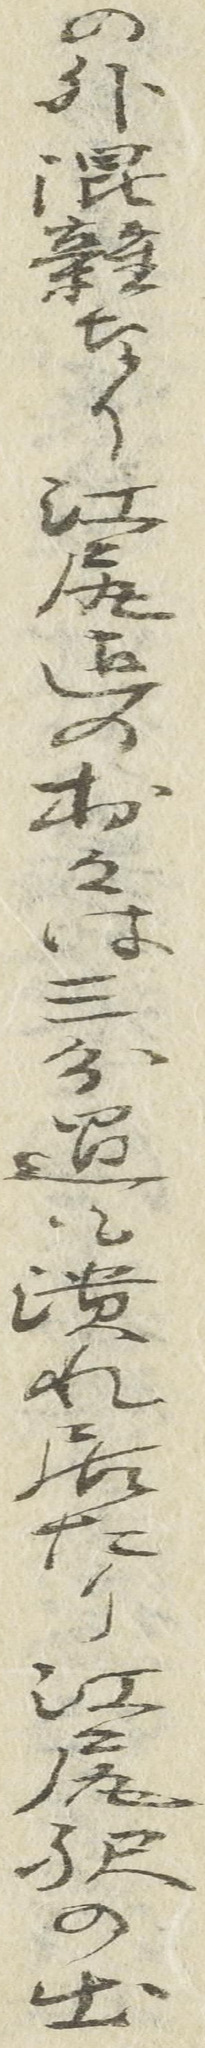の外混雑なり江尻迄の村々は三分過も潰れ居たり江尻駅の出
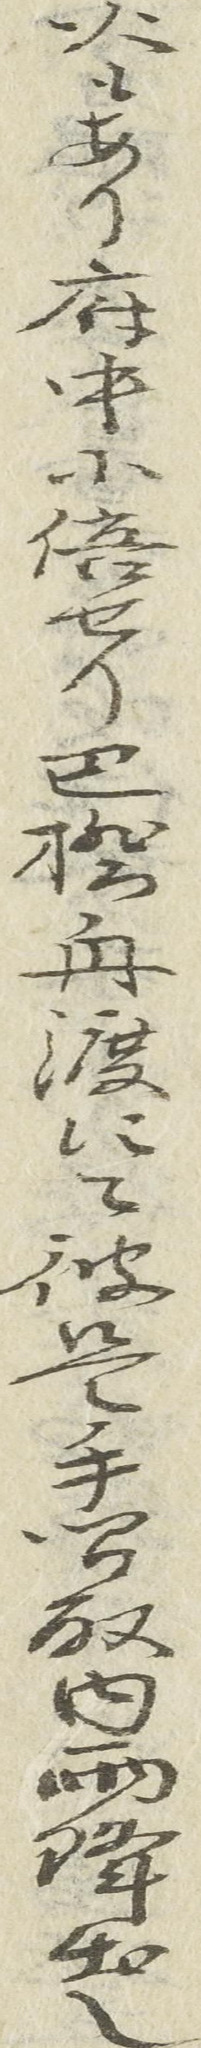火もあり府中に倍せり巴橋舟渡にて彼是手間取内雨降出し
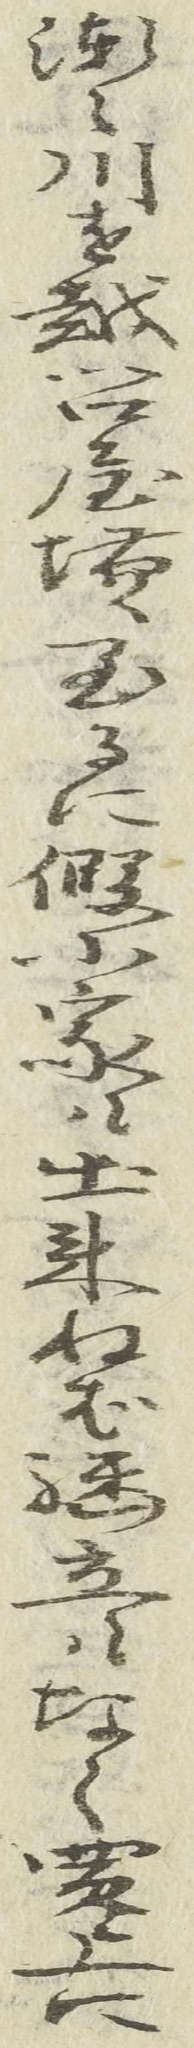漸〻川を越問屋場へ至るに假小家も出来ねば継立もなく買上に
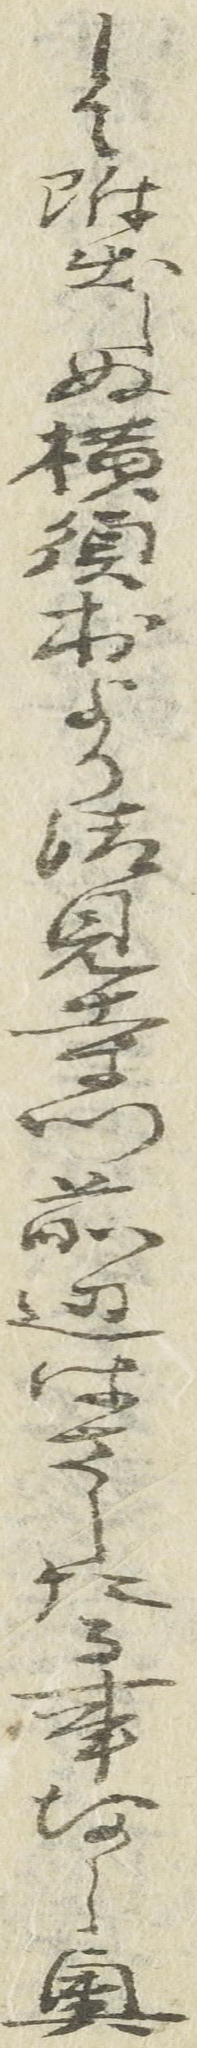して附出しぬ須賀村より清見寺門前辺はさしたる事なし奥
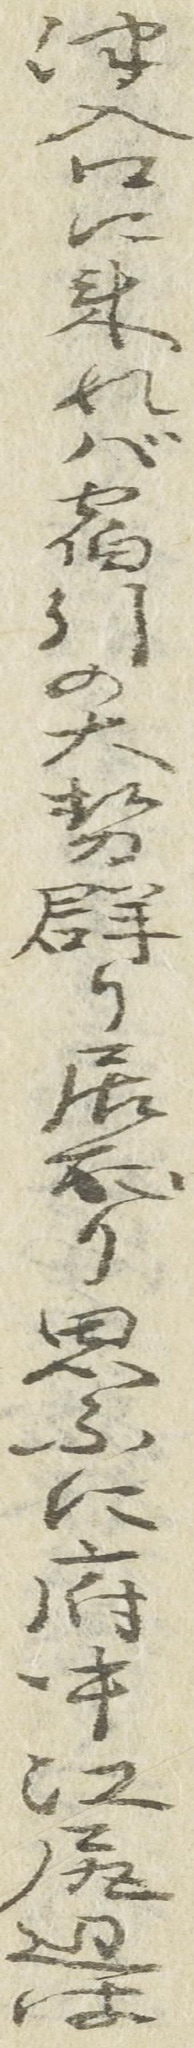津入口に来れば宿引の大勢群り居けり思ふに府中江尻辺は
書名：地震前兆集　全
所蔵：東京大学地震研究所図書室 Earthquake Research Institute Library, The University of Tokyo, JAPAN
